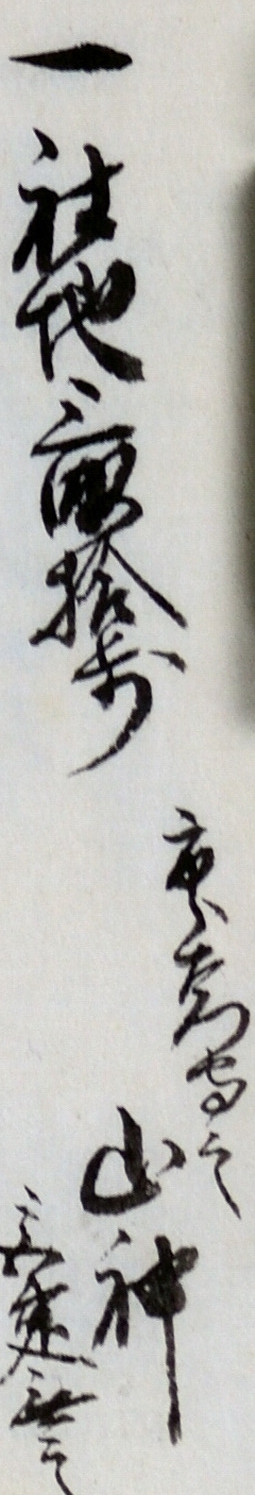一社地三畝拾歩山神
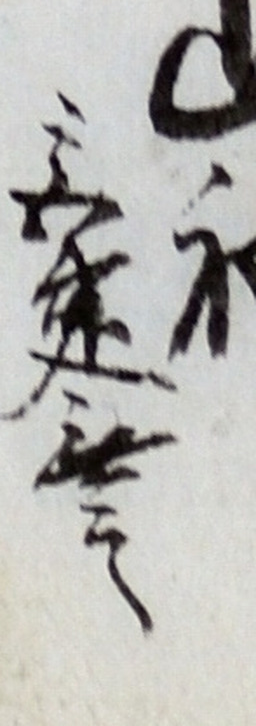宮建無之
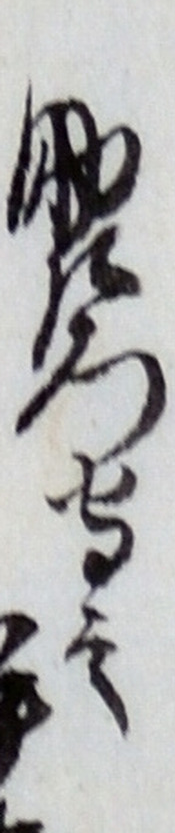助左衛門守之
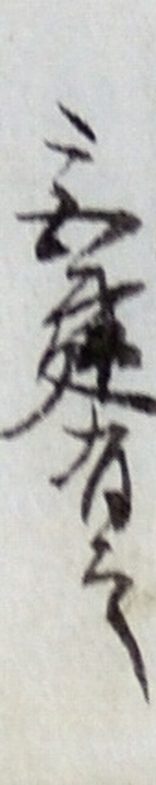宮建有之
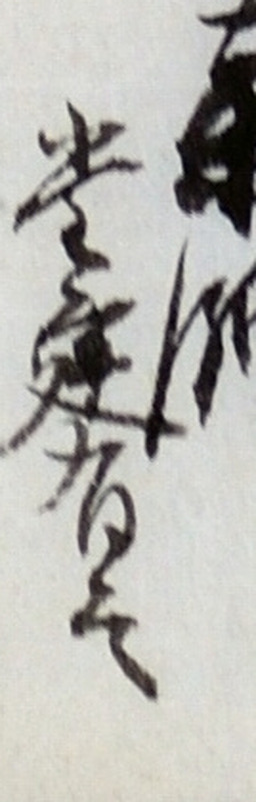堂建有之
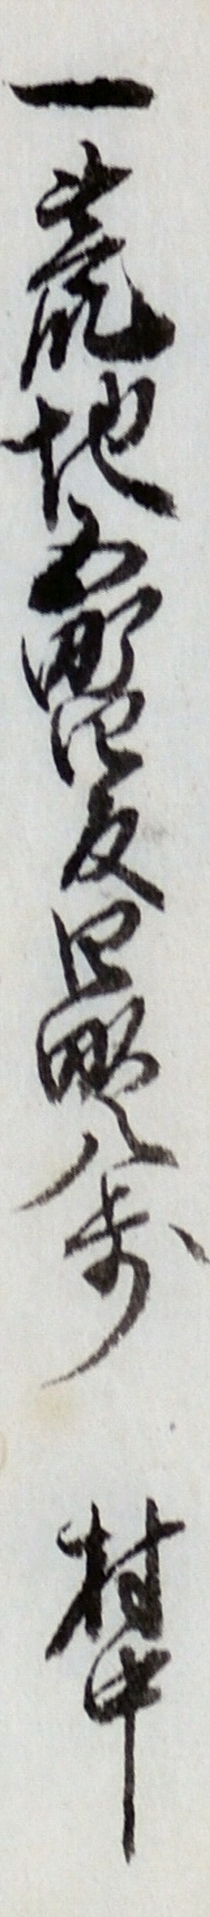一荒地五町四反四畝八歩村中
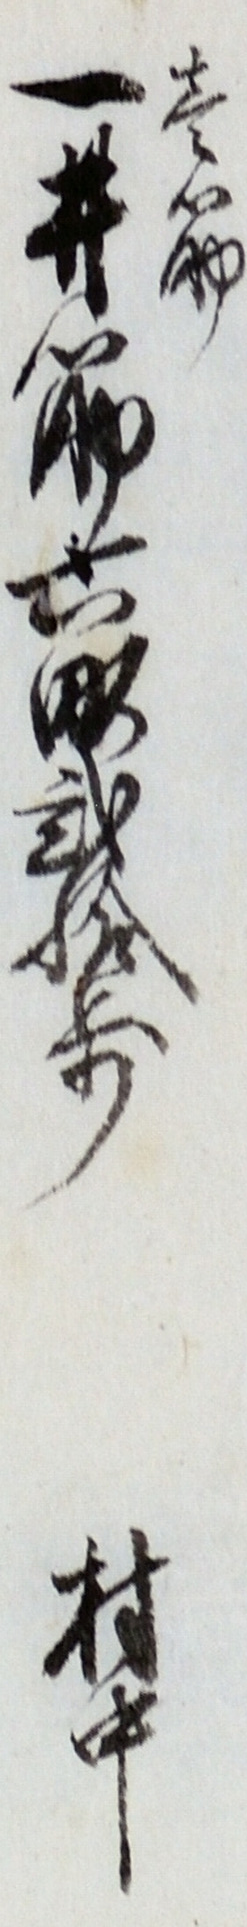一井筋六畝弐拾歩村中
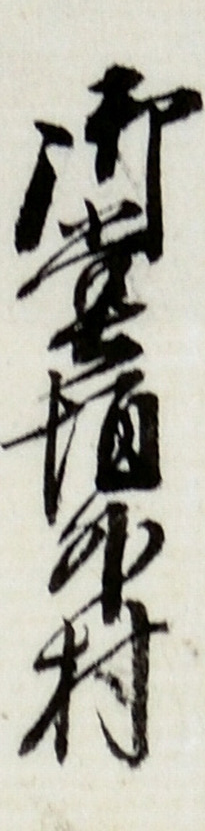御堂垣外村
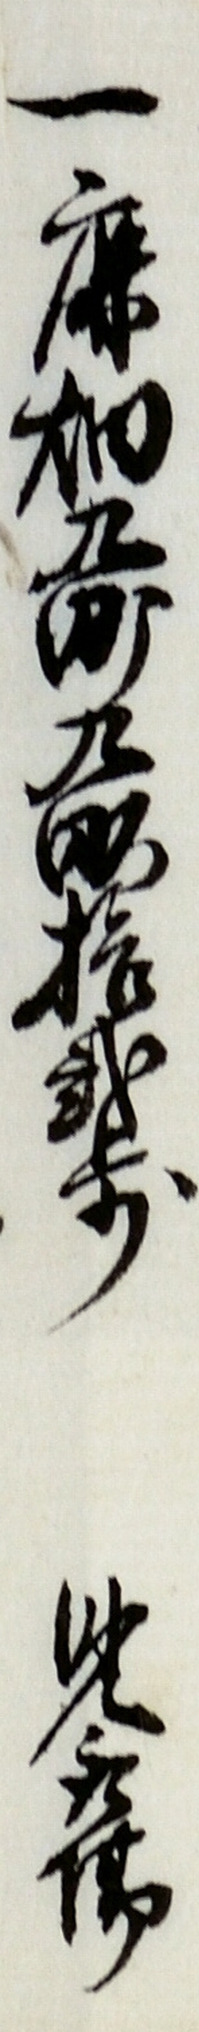一麻畑九町五畝拾弐歩見取場
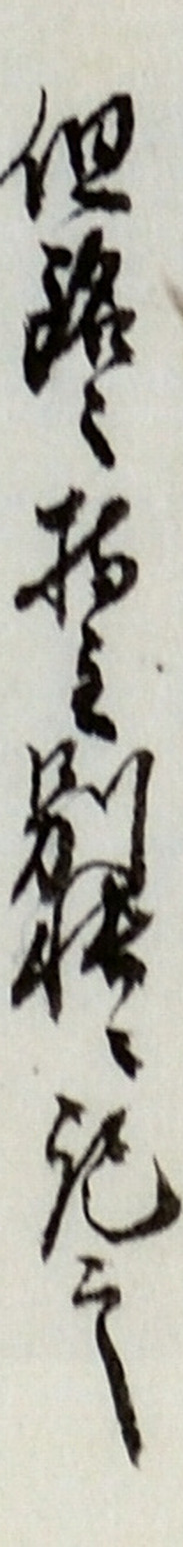但銘々持主別帳ニ記之
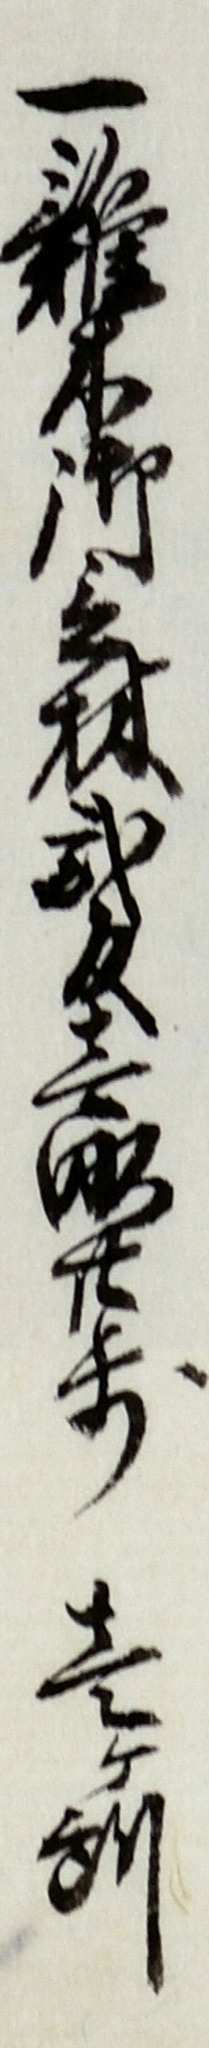一雑木御立林弐反壱畝廿歩壱ヶ所
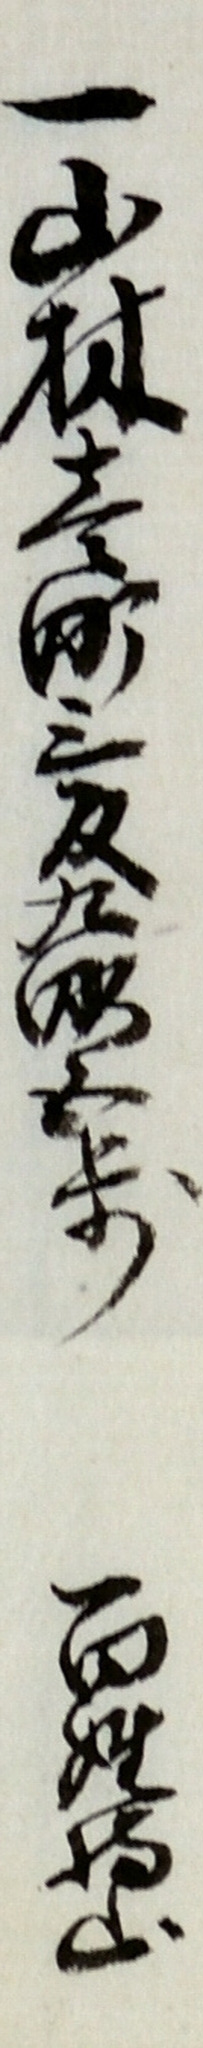一山林壱町三反九畝五歩百姓持山
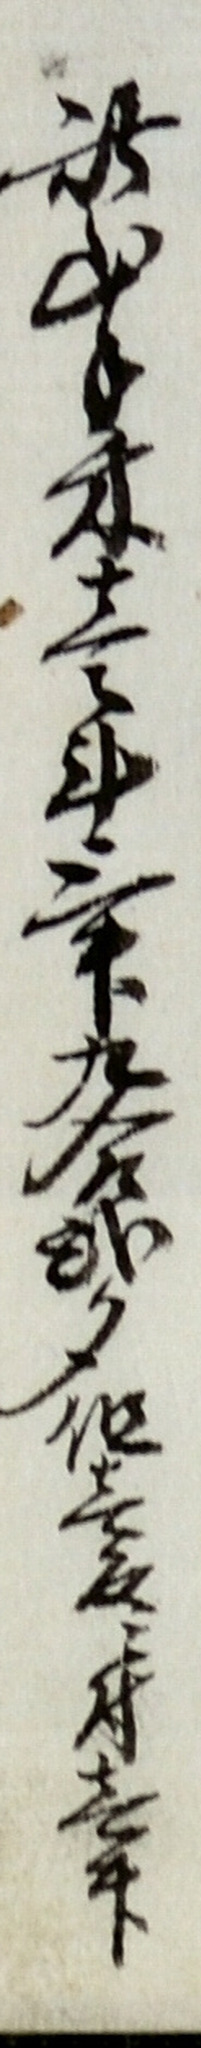此山手米壱斗三升九合二夕但壱反ニ付壱合
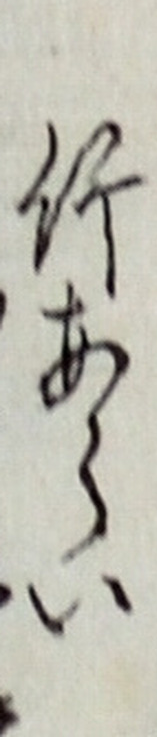竹あらい
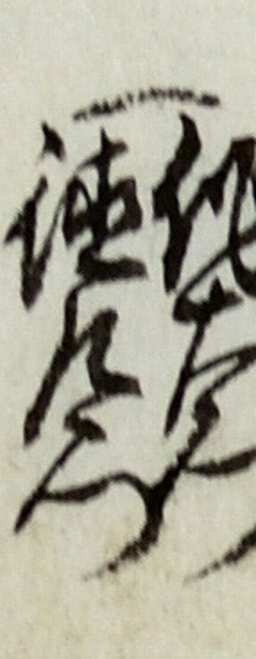徳左衛門
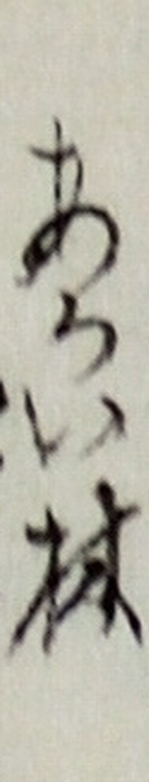あかい林
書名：御領分中山林社地手控
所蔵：伊那市立高遠町図書館・合同会社AMANE
